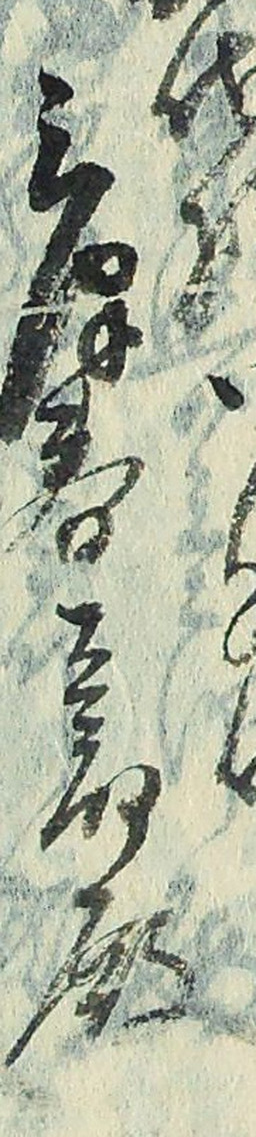三沢春太郎殿
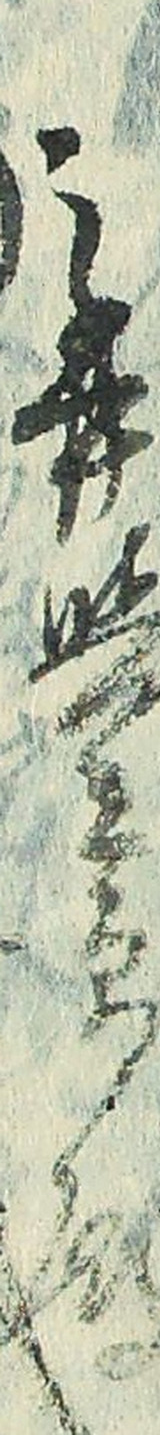高井与三兵衛殿
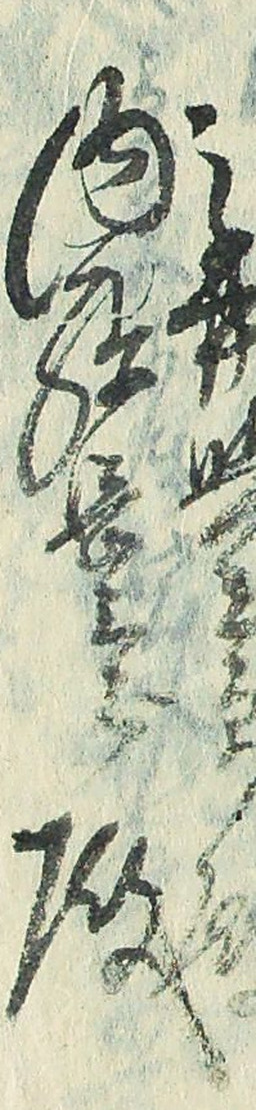内藤長三郎殿

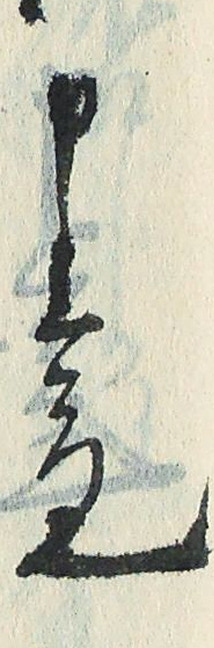申上覚
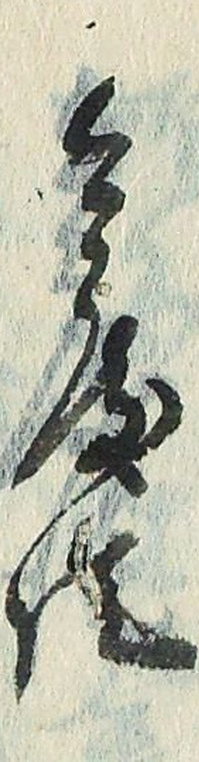今度従
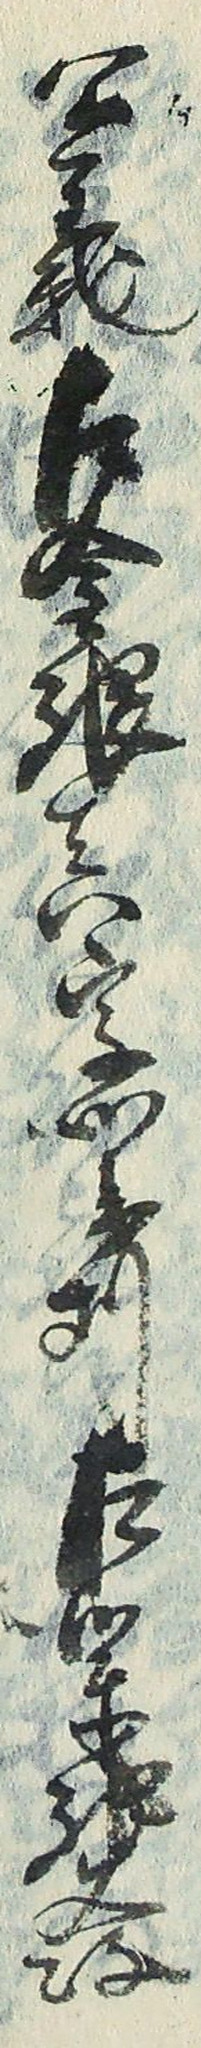公義古金銀真字弐歩判古弐朱銀文政
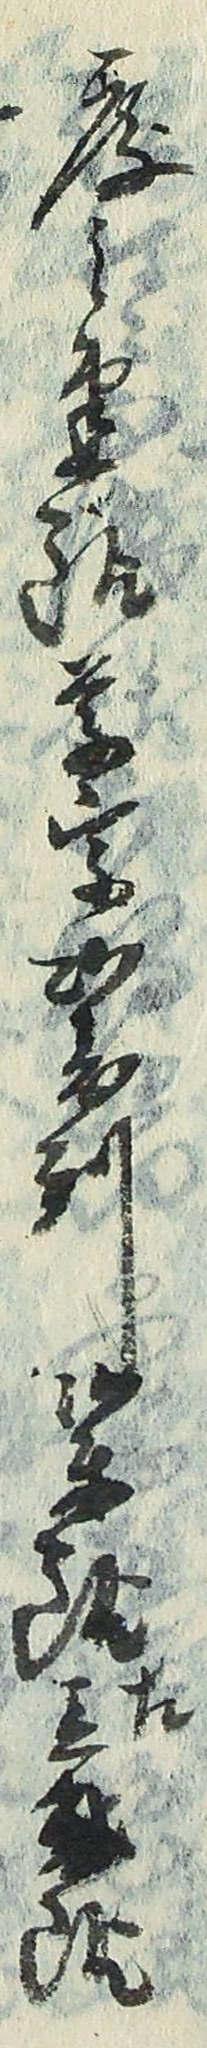度之金銀草字弐歩判弐朱銀古壱朱銀
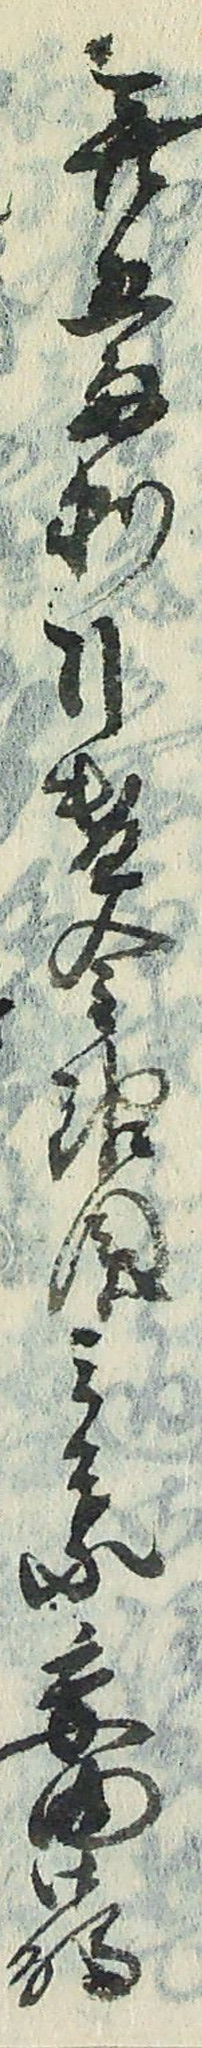幷五両判引替金銀円之義委細御触
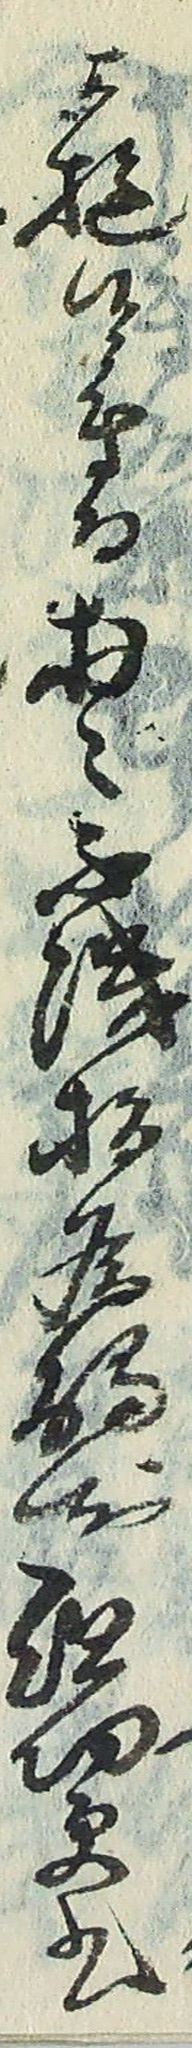被遊候に付而村々不洩様為触知組切受書
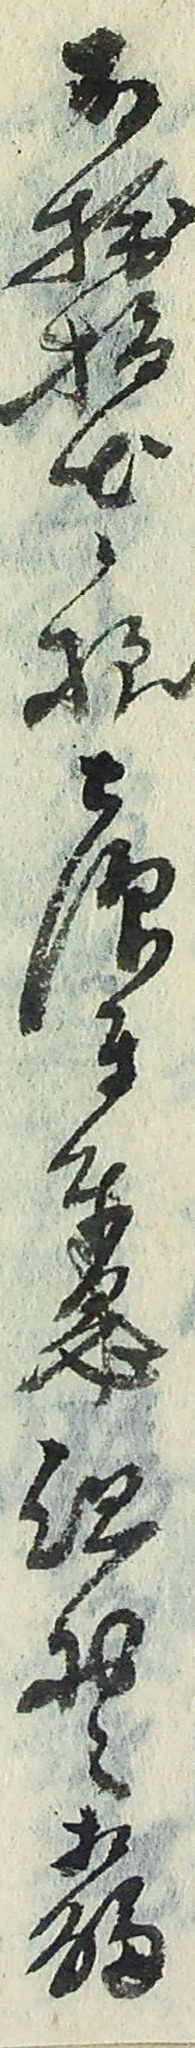取揃指出候様被仰付奉畏組村々相触
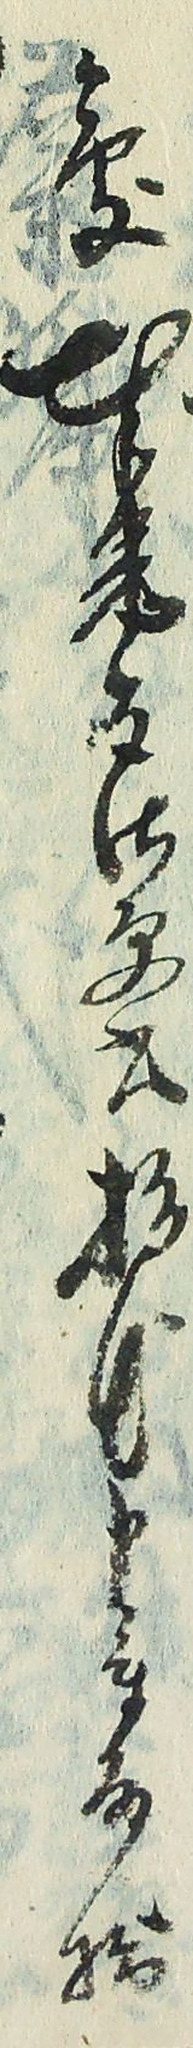候処奉畏旨御受書指出申に付取揃
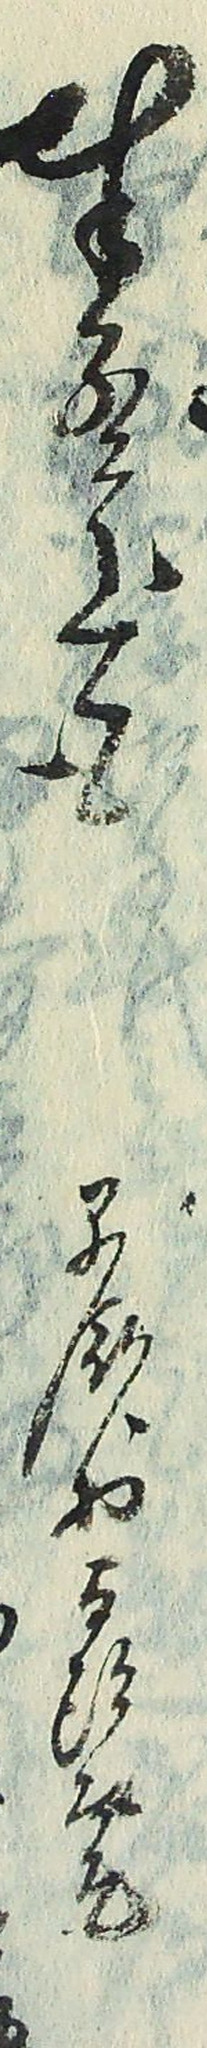奉差上候以上早淵村与頭庄屋
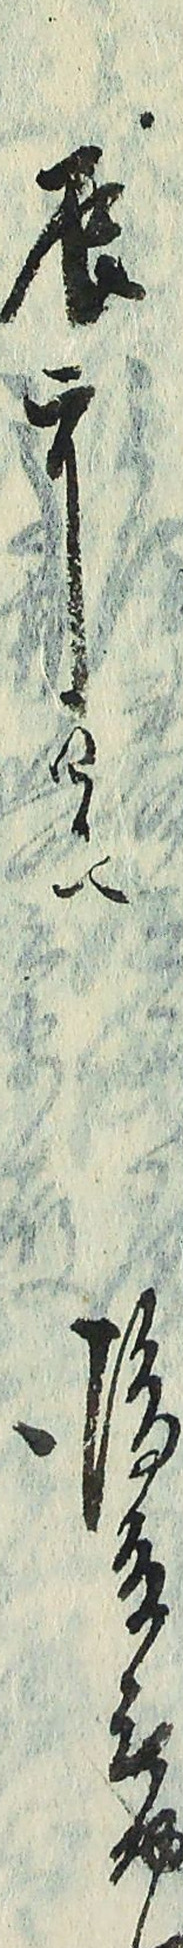辰弐月四日後藤庄助
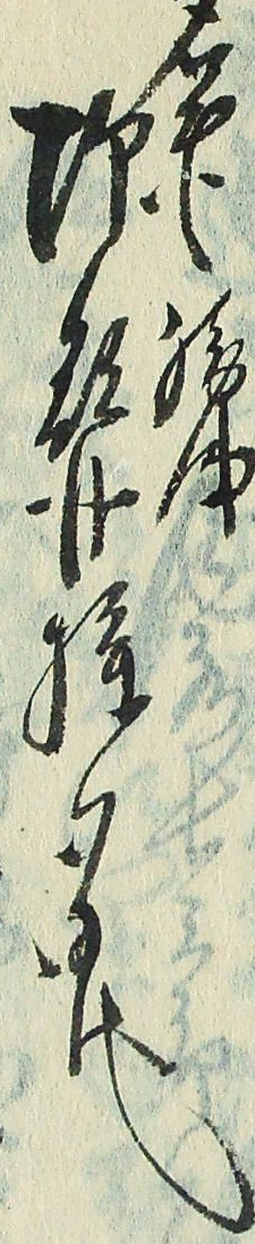御郡代様御手代
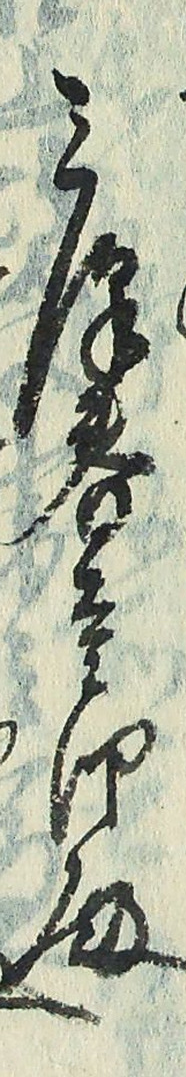三沢春太郎殿
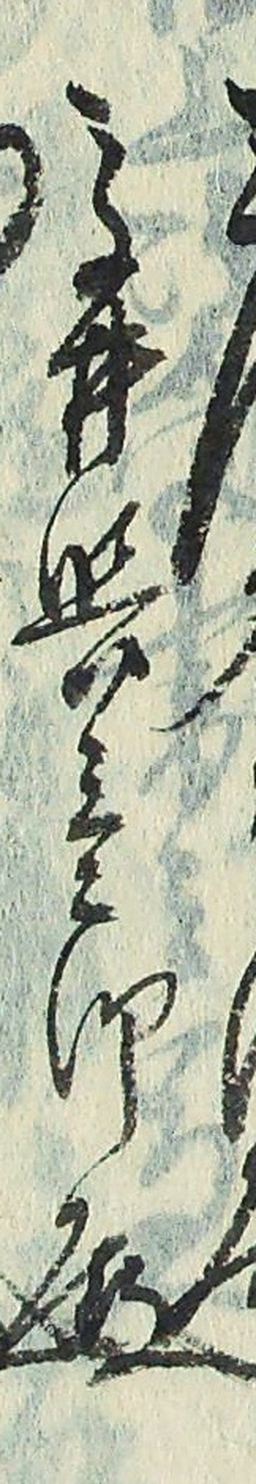高井与三郎殿
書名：諸御用御□受書控
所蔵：鳴門教育大学 Naruto University of Education
